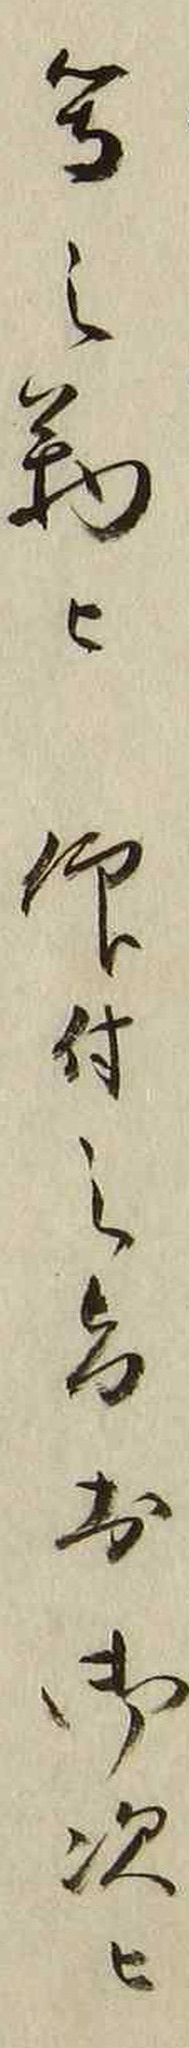等之勤被仰付之旨於御次被
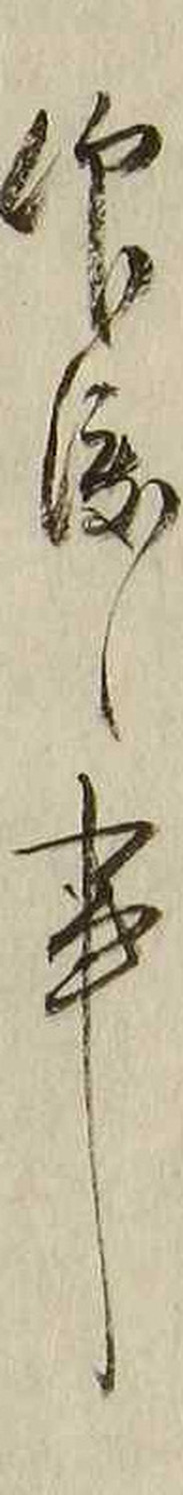仰渡候事
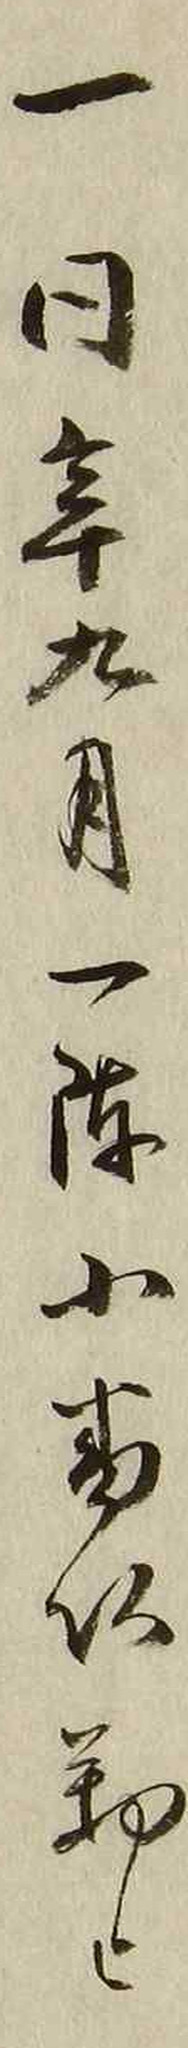一同年九月一陣小番頭勤被
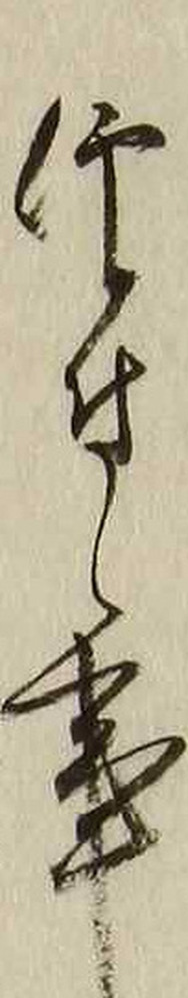仰付候事
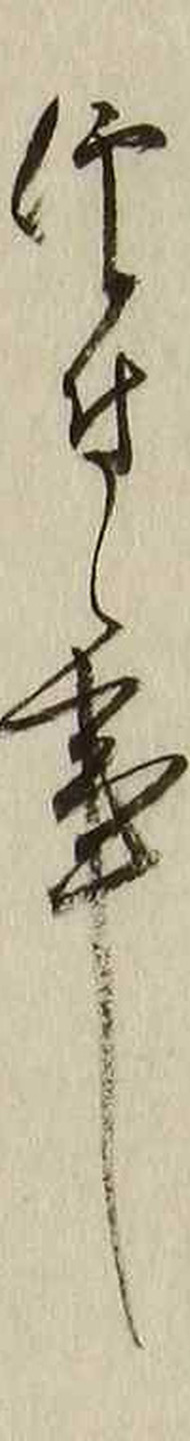仰付候事
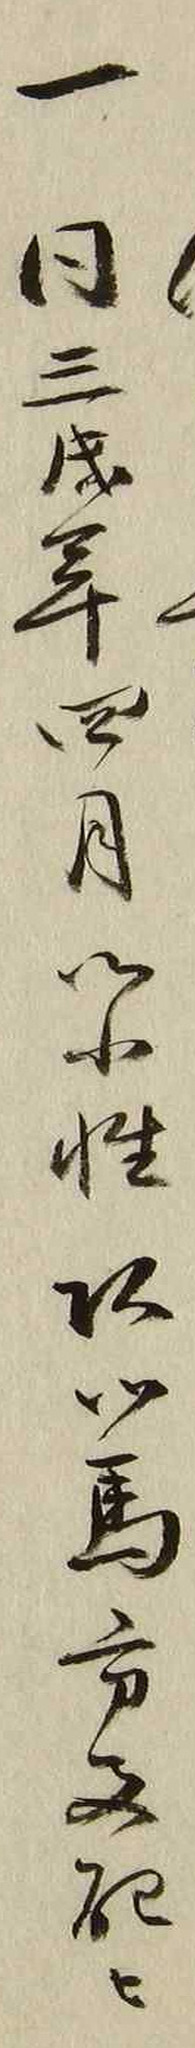一同三戌年四月御小姓頭御馬方支配被
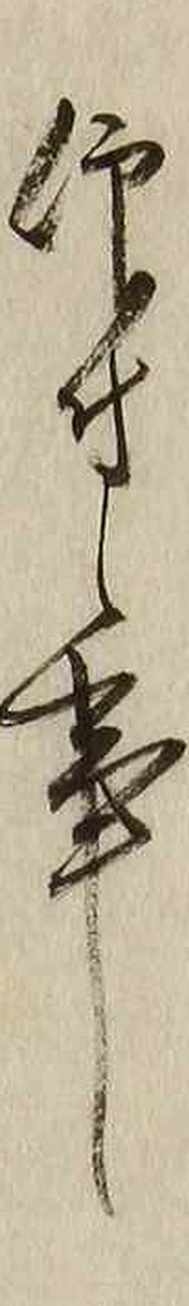仰付候事
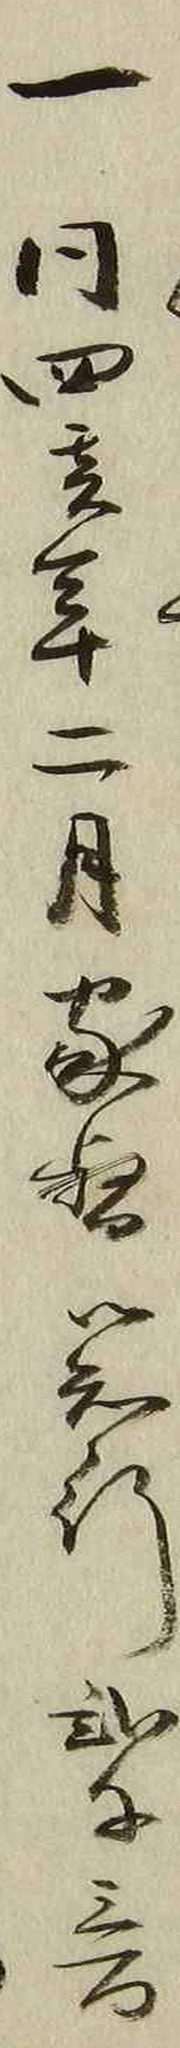一同四亥年二月家督御知行弐千三百
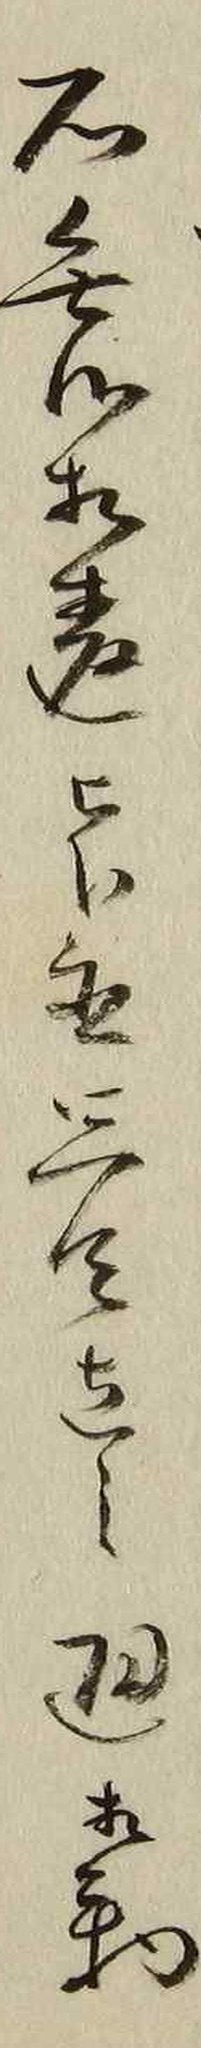石無御相違被下置只今迄之通相勤
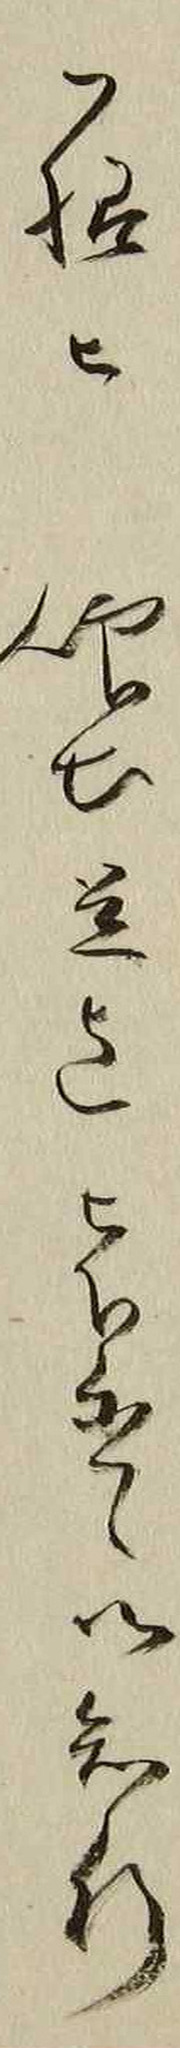候様被仰出是迄被下置候御知行
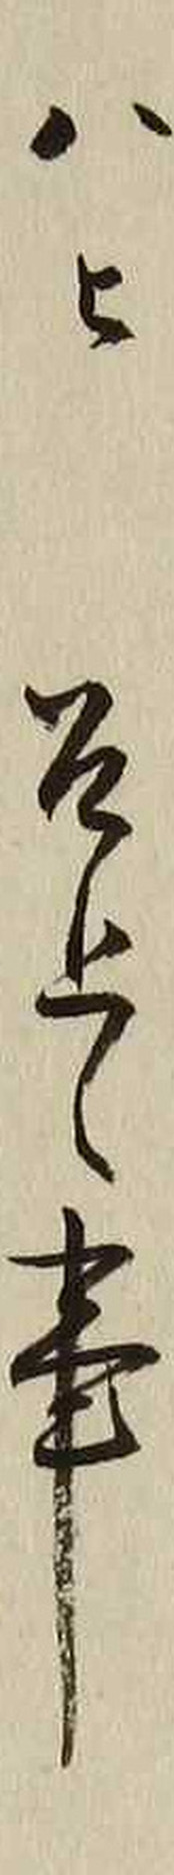は被召上候事
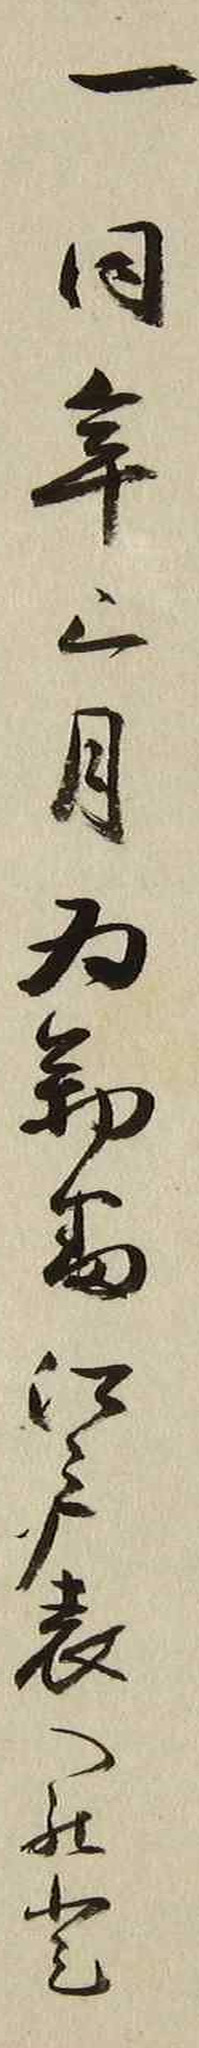一同年三月為勤番江戸表へ罷登
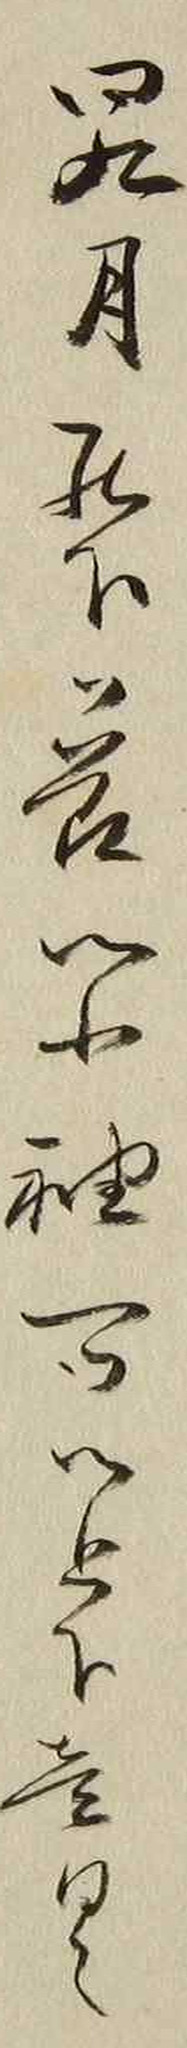同九月罷下候節御小袖一つ御上下壱具
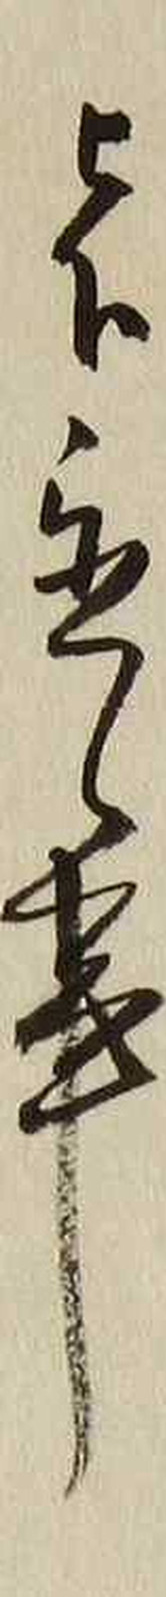被下置候事
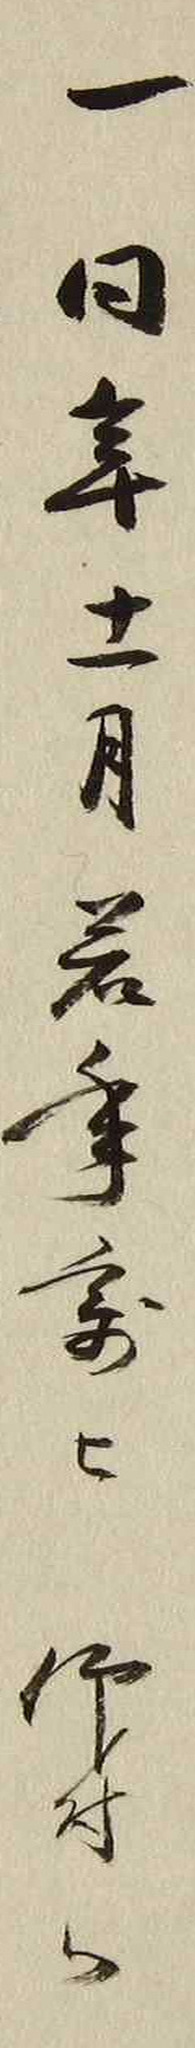一同年十一月若年寄被仰付候
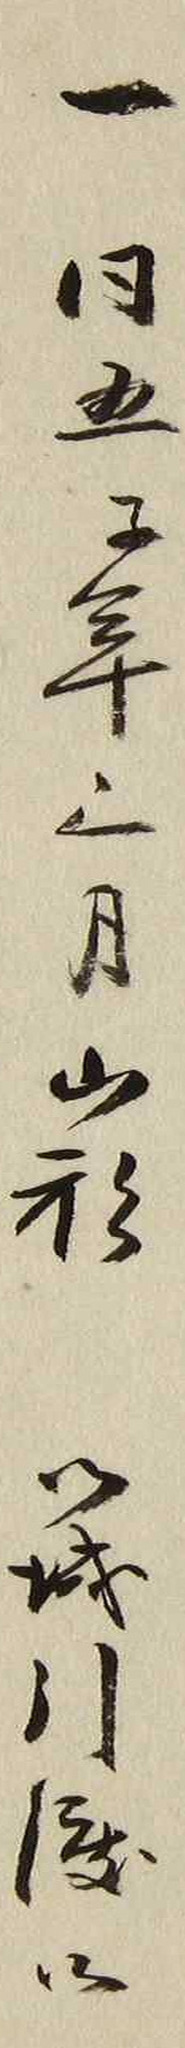一同五子年三月山形御城引渡御
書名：諸士系譜　巻之292　き之部1
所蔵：会津若松市立会津図書館
